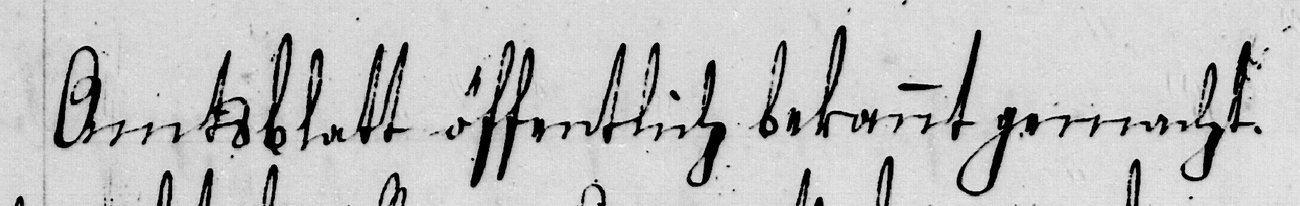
Amtsblatt öffentlich bekannt gemacht.
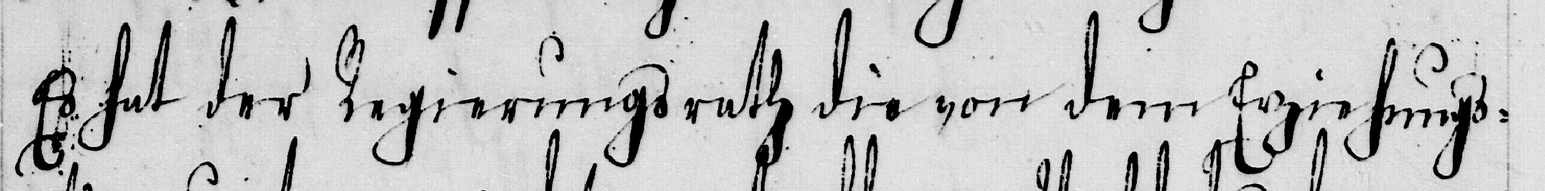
Es hat der Regierungsrath die von dem Erziehungs¬
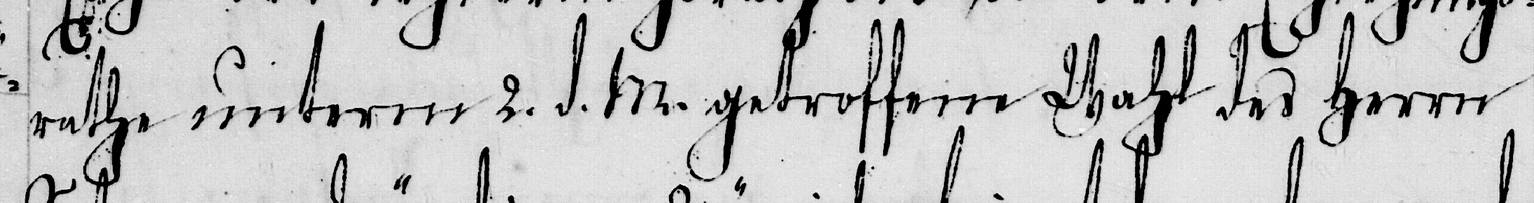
rath unterm 2. d. M. getroffene Wahl des Herrn
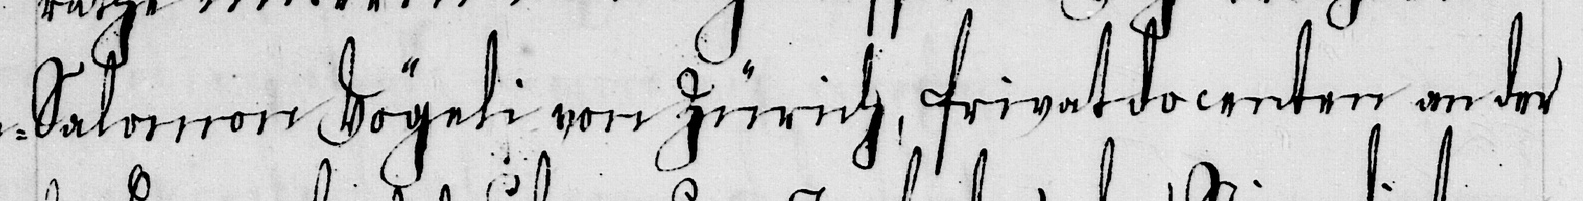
Salomon Vögeli von Zürich, Privatdocenten an der
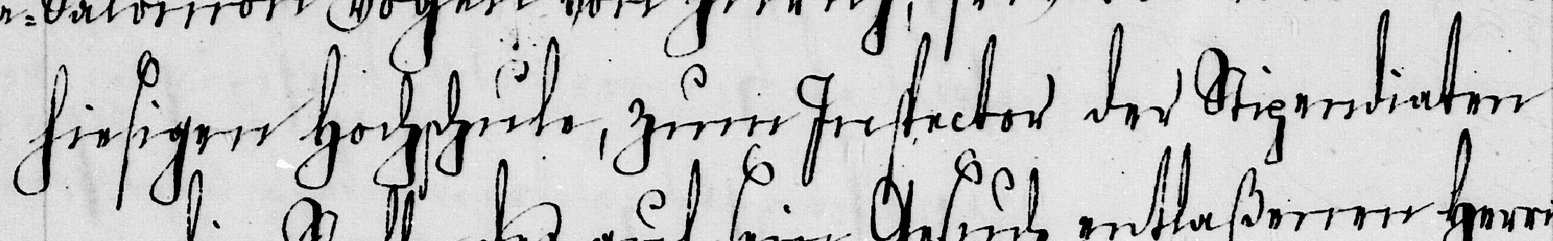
hiesigen Hochschule, zum Inspector der Stipendiaten
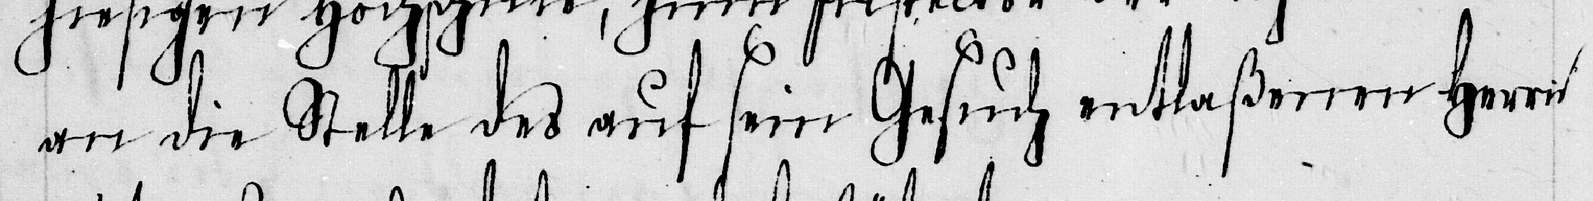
an die Stelle des auf sein Gesuch entlaßenen Herrn
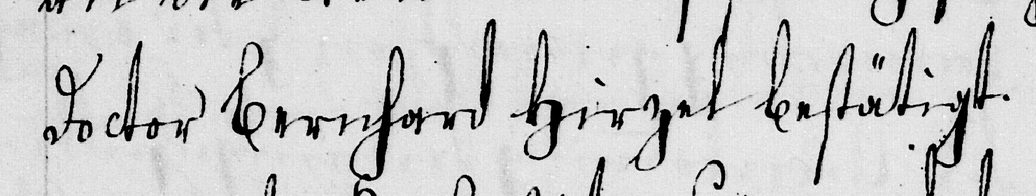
Doctor Berhard Hirzel bestätigt.
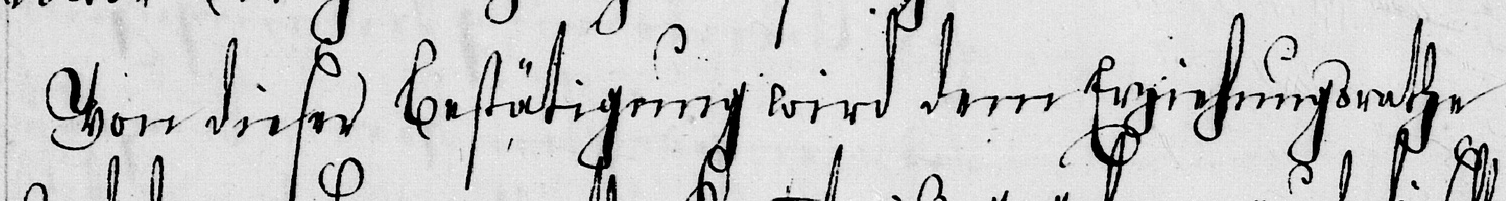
Von dieser Bestätigung wird dem Erziehungsrathe
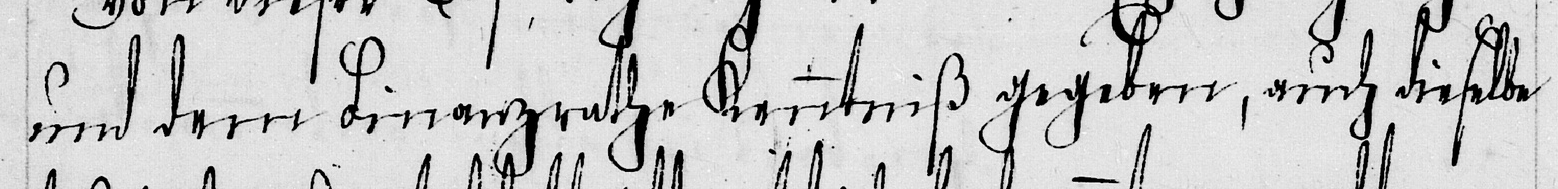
und dem Finanzrathe Kenntniß gegeben, auch dieselbe
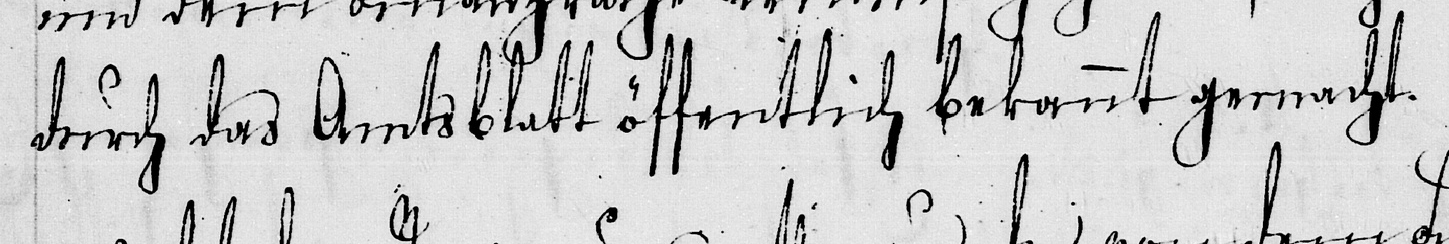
durch das Amtsblatt öffentlich bekannt gemacht.
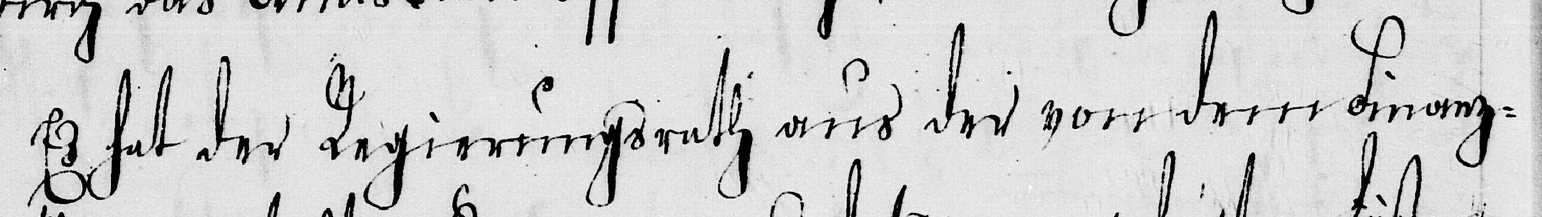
Es hat der Regierungsrath aus der von dem Finanz¬
